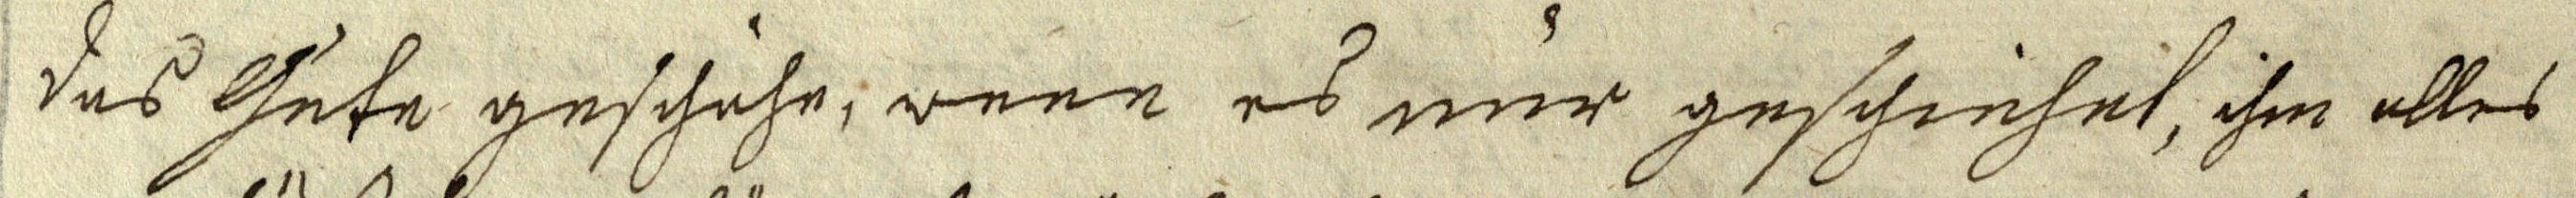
das Gute geschähe, wenn es nur geschiehet, ihm alles
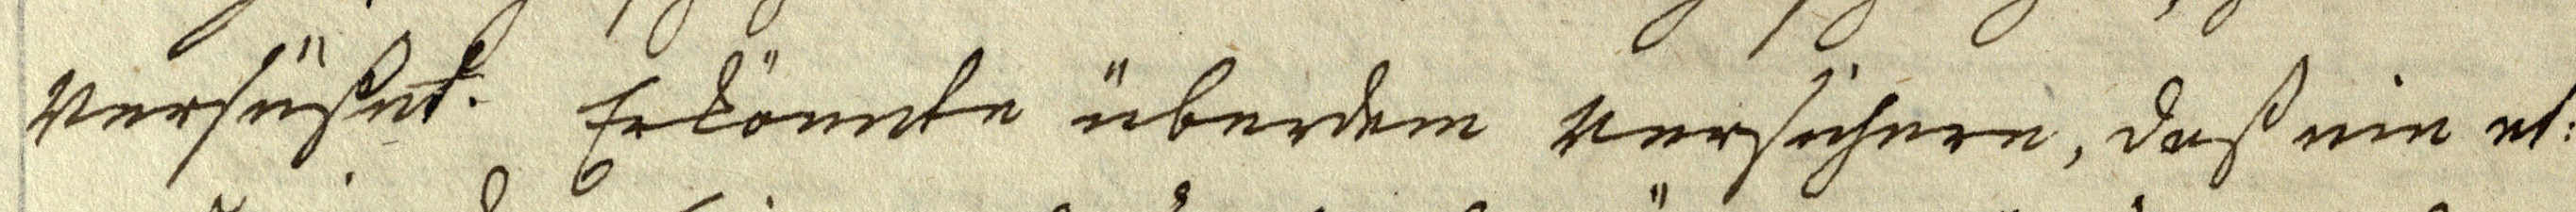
versüßet. Er könnte überdem versichern, daß nie et¬
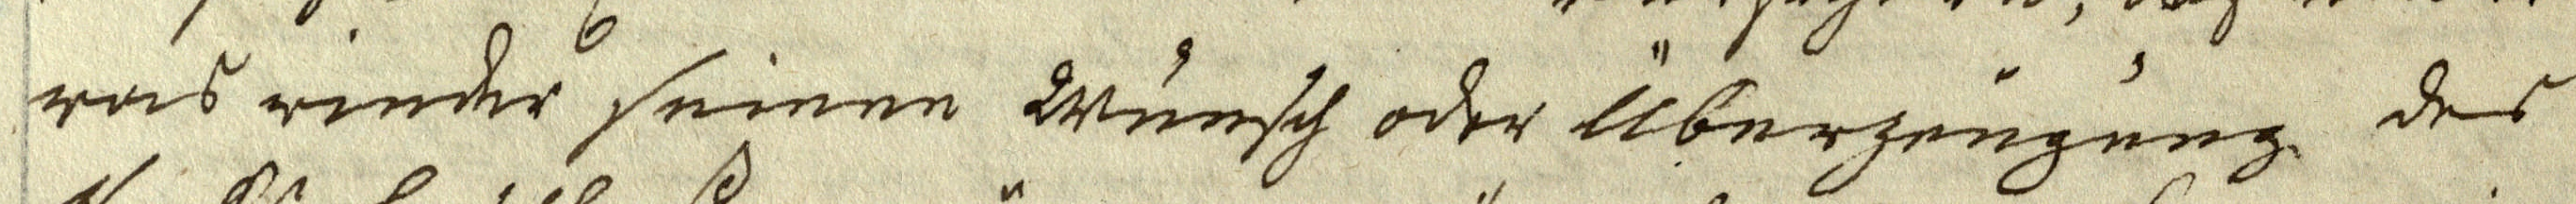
was wieder seinen Wunsch oder Überzeugung des
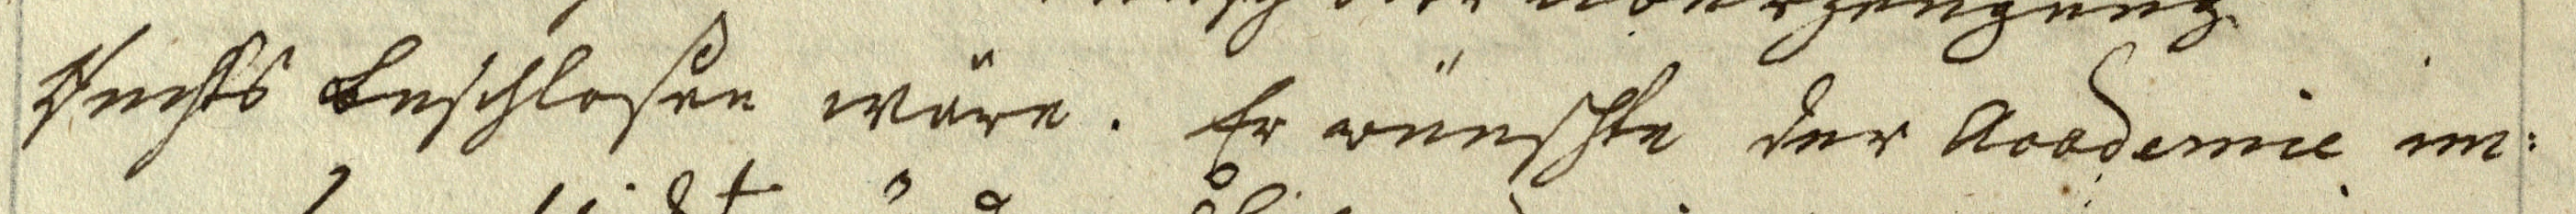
Rechts beschloßen wäre. Er wünschte der Academie im¬
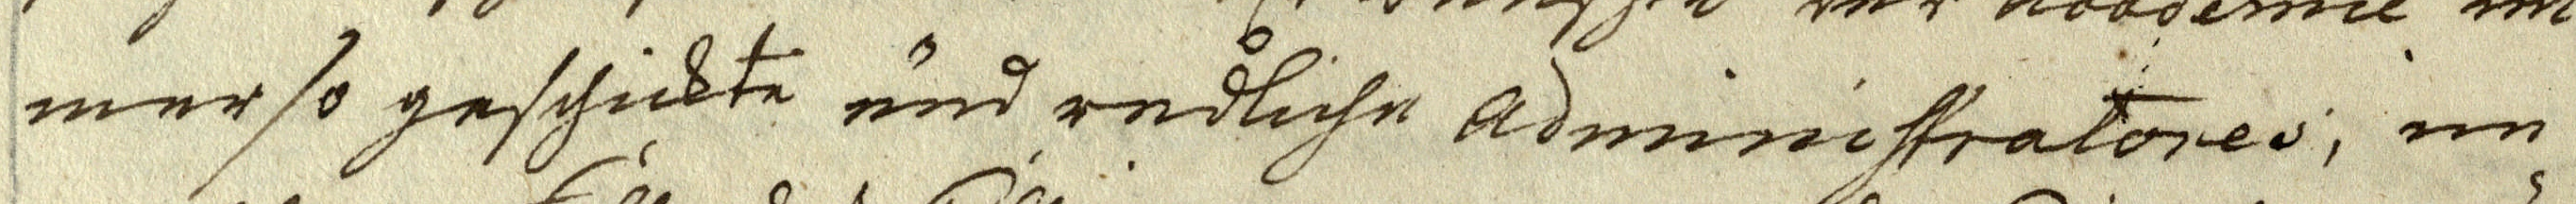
mer so geschickte und redliche Administratores, im
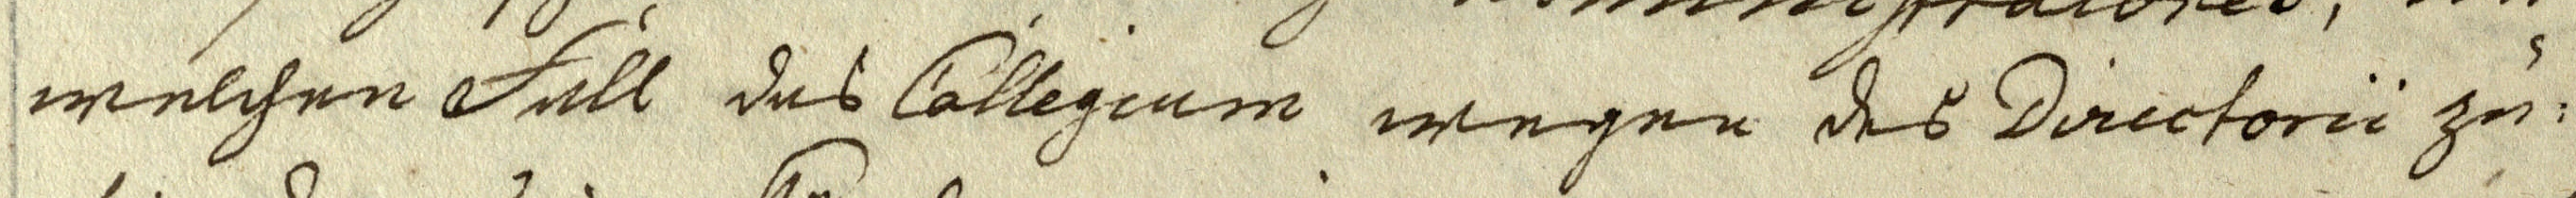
welchen Fall das Collegium wegen des Directorii zu¬
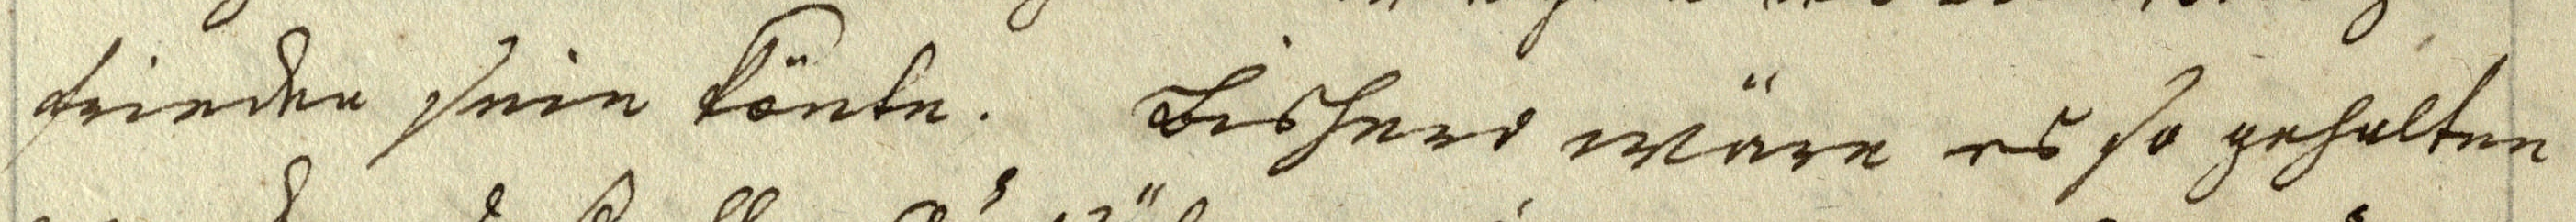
frieden sein könte. Bishero wäre es so gehalten
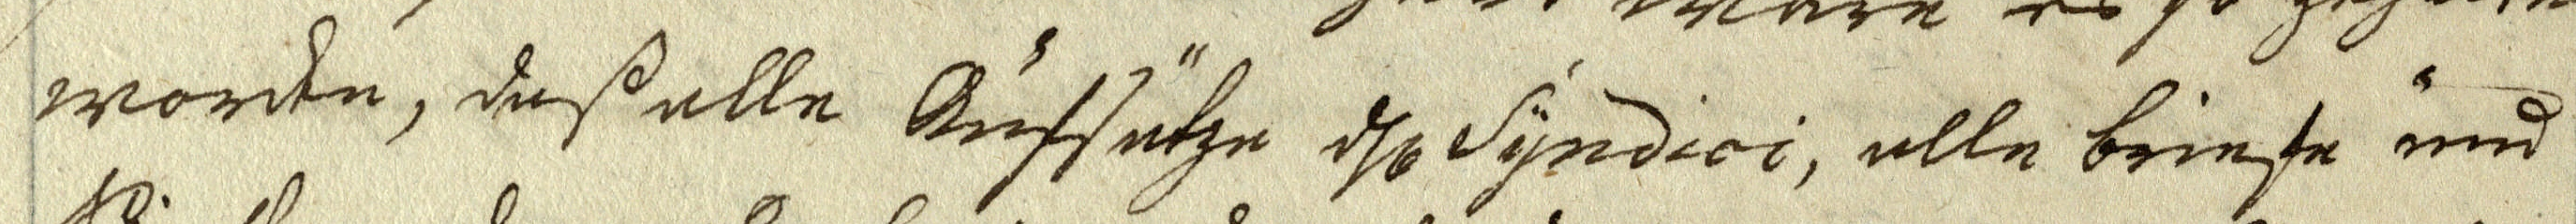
worden, daß alle Aufsätze dh. Sÿndici, alle Briefe und
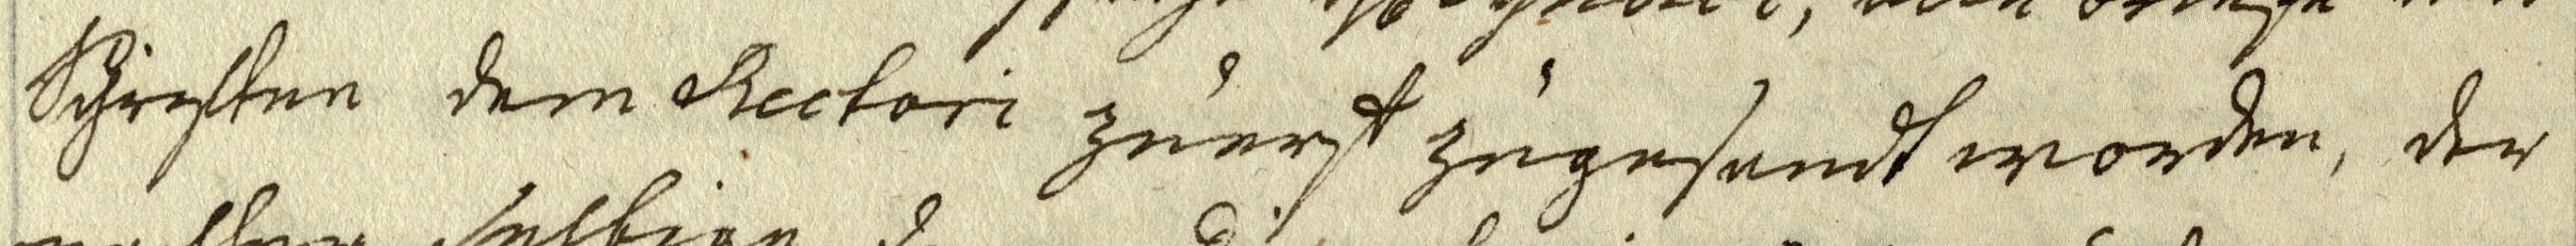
Schriften dem Rectori zuerst zugesandt worden, der
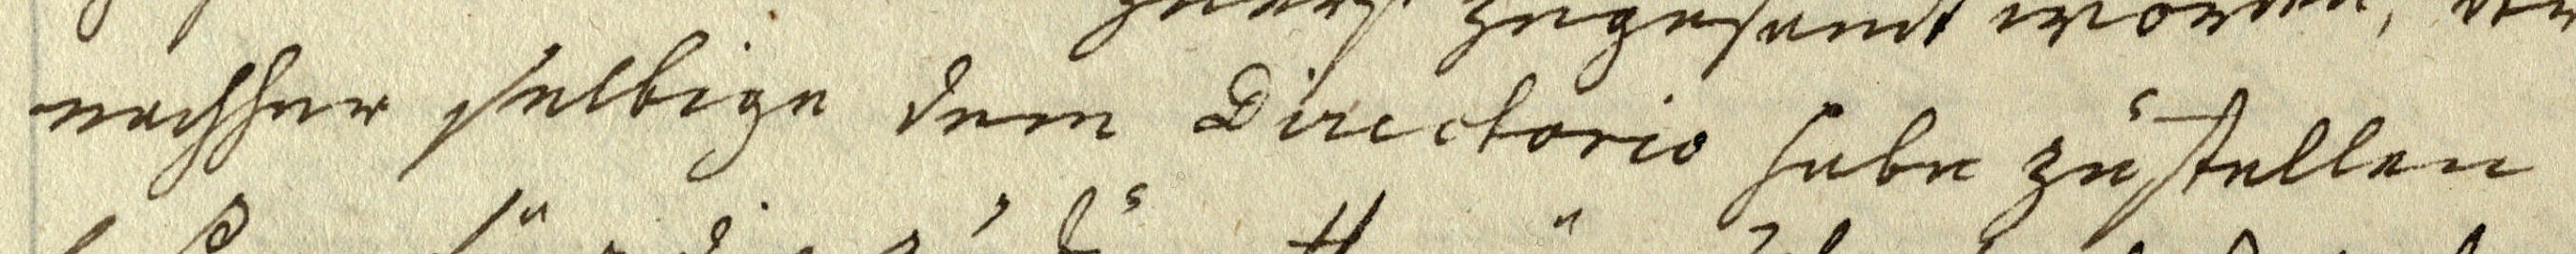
nachher selbige dem Directorio habe zustellen
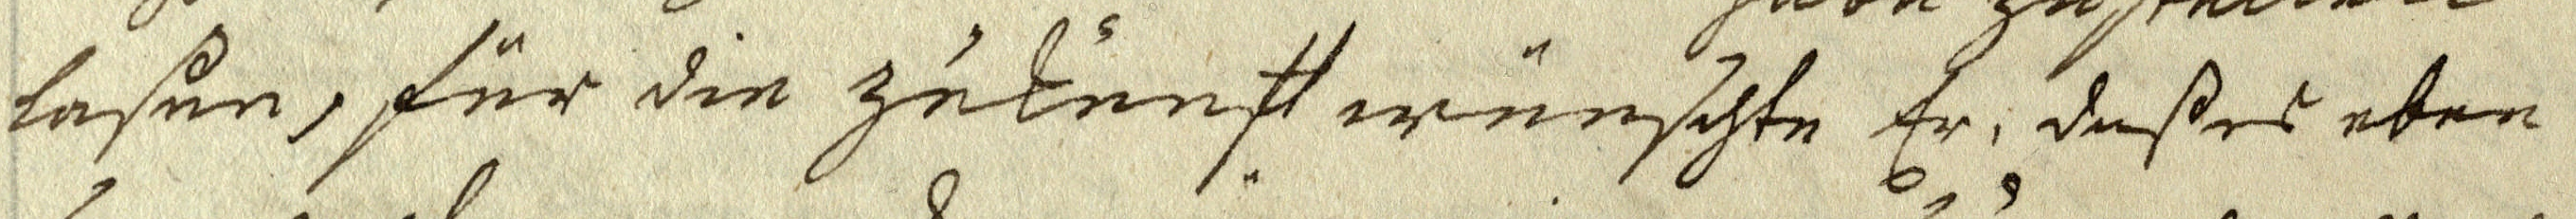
laßen, für die Zukunft wünschte Er, daß es eben¬
